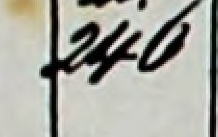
246
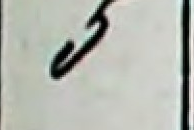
5
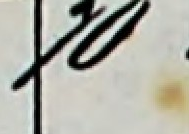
70
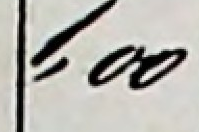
1,00
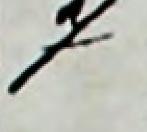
7
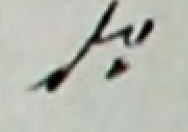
do
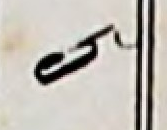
5
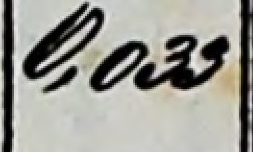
0,033
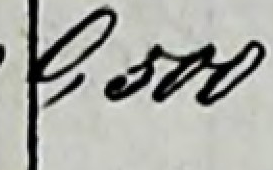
0,500
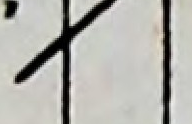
7
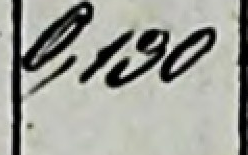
0,130
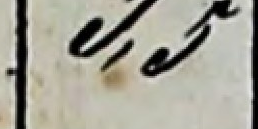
3,5
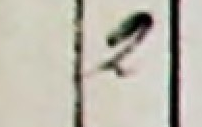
2
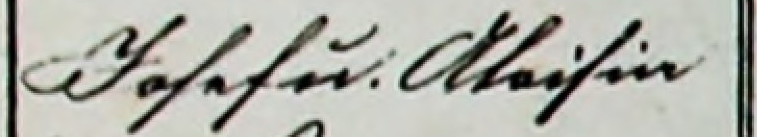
Josef u. Aloisia
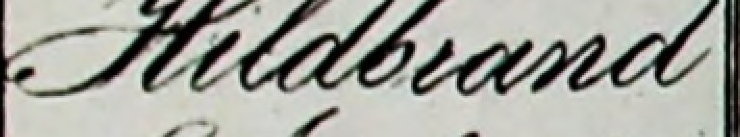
Hildbrand
